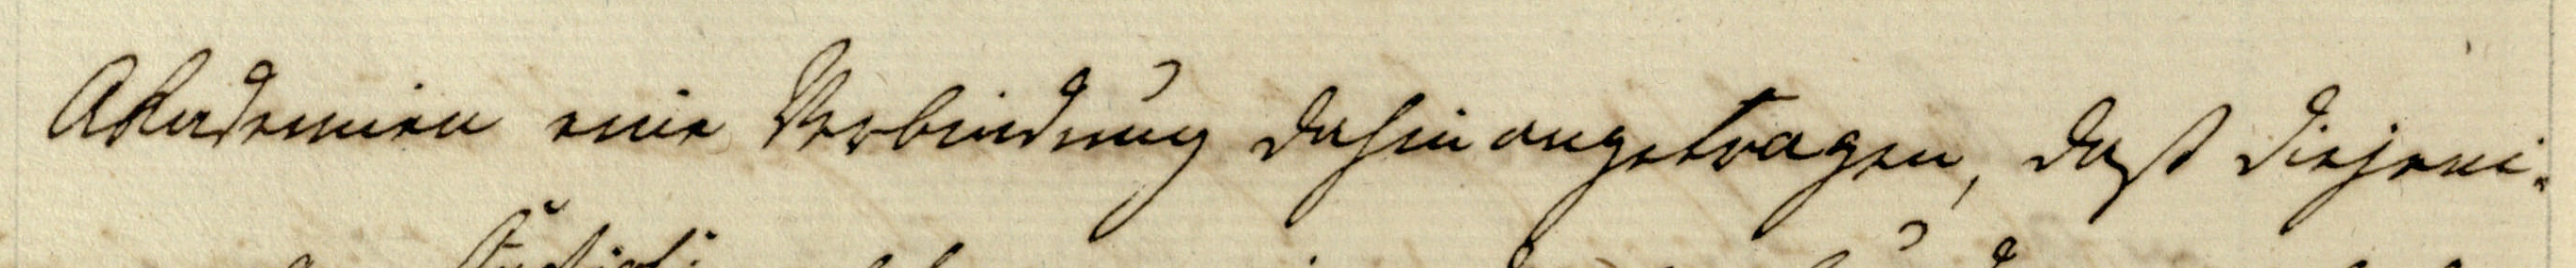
Akademien eine Verbindung dahin angetragen, daß diejeni¬
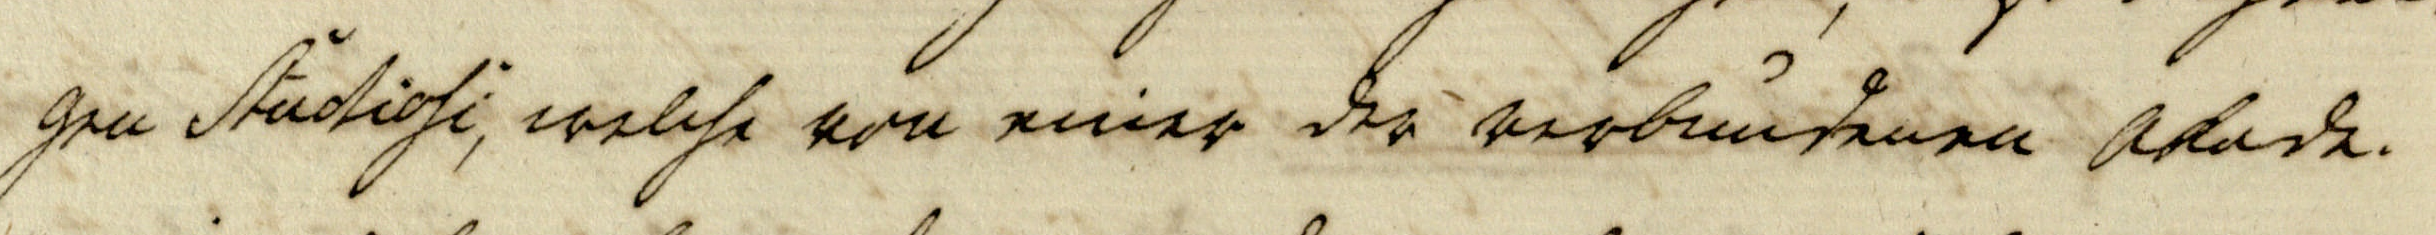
gen Studiosi, welche von einer der verbundenen Akade¬
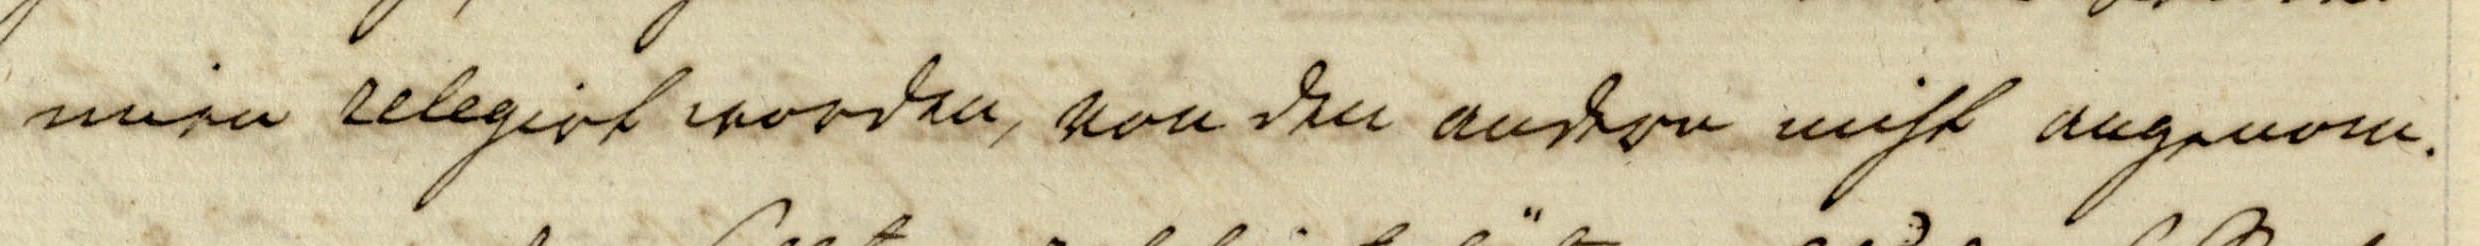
einen relegirt worden, von den andern nicht angenom¬
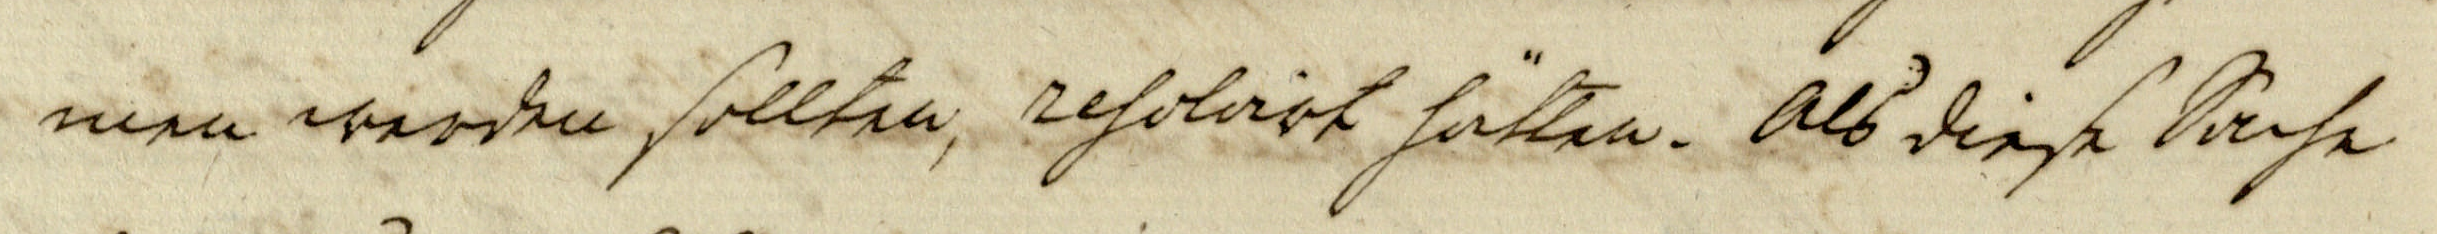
men werden sollten, resolvirt hätten. Als diese Sache
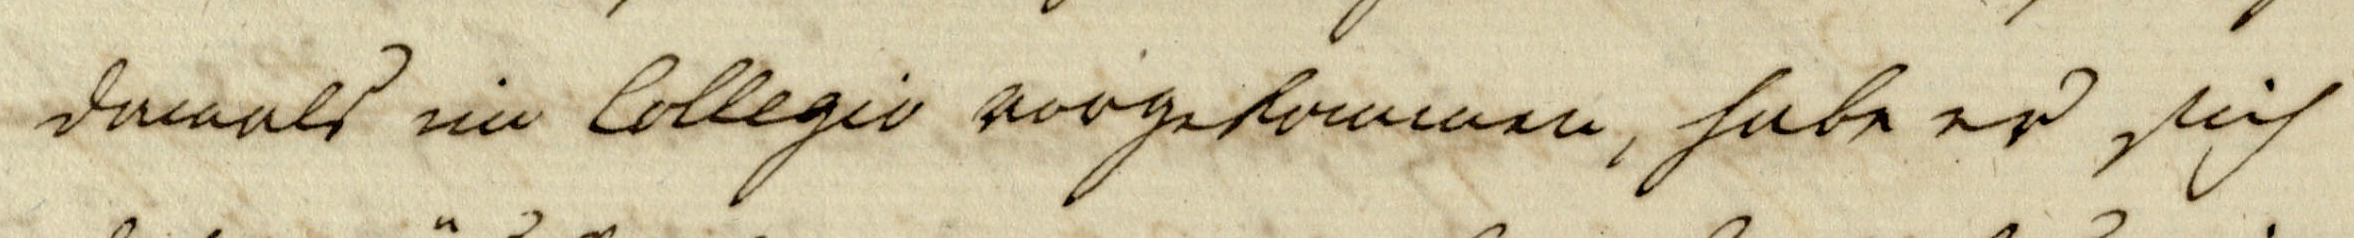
damals im Collegio vorgekommen, habe er sich
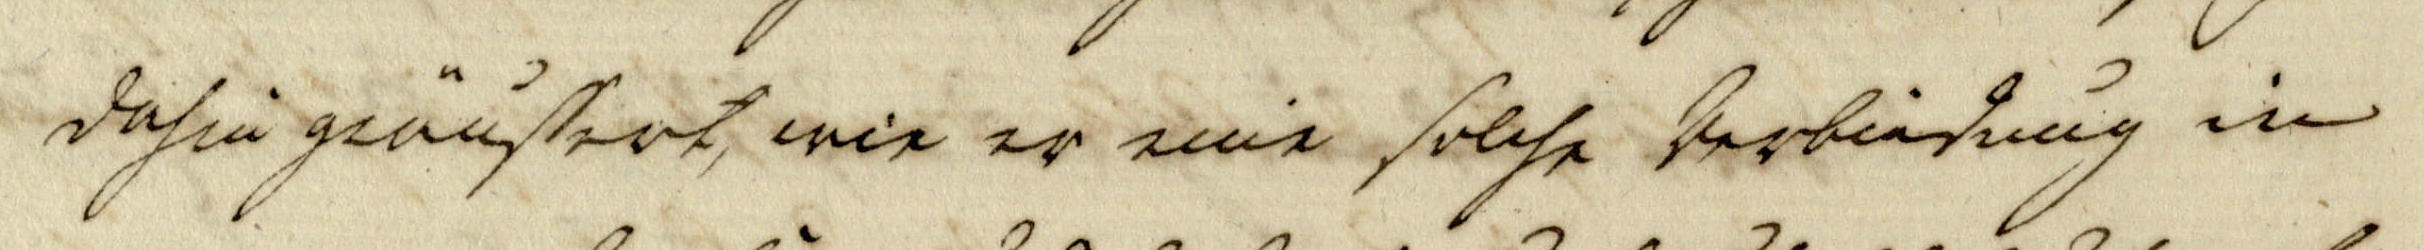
dahin geäussert, wie er eine solche Verbindung in
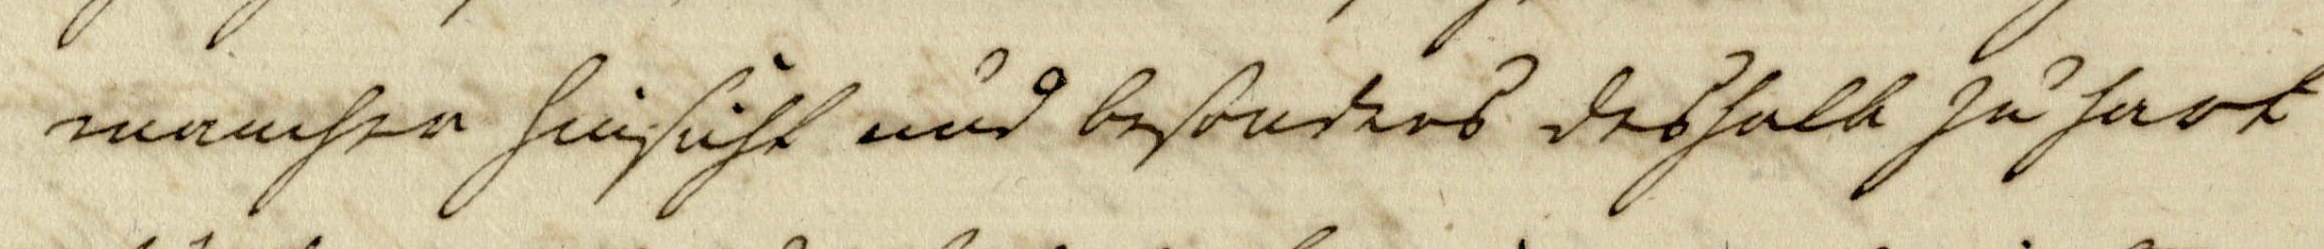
mancher Hinsicht und besonders deshalb zu hart
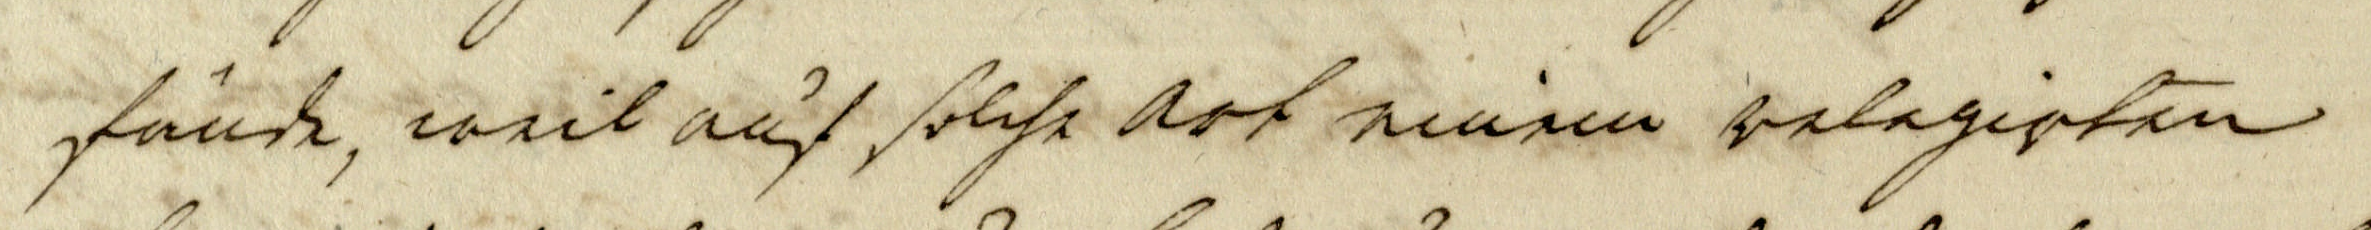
fände, weil auf solche Art einem relegirten
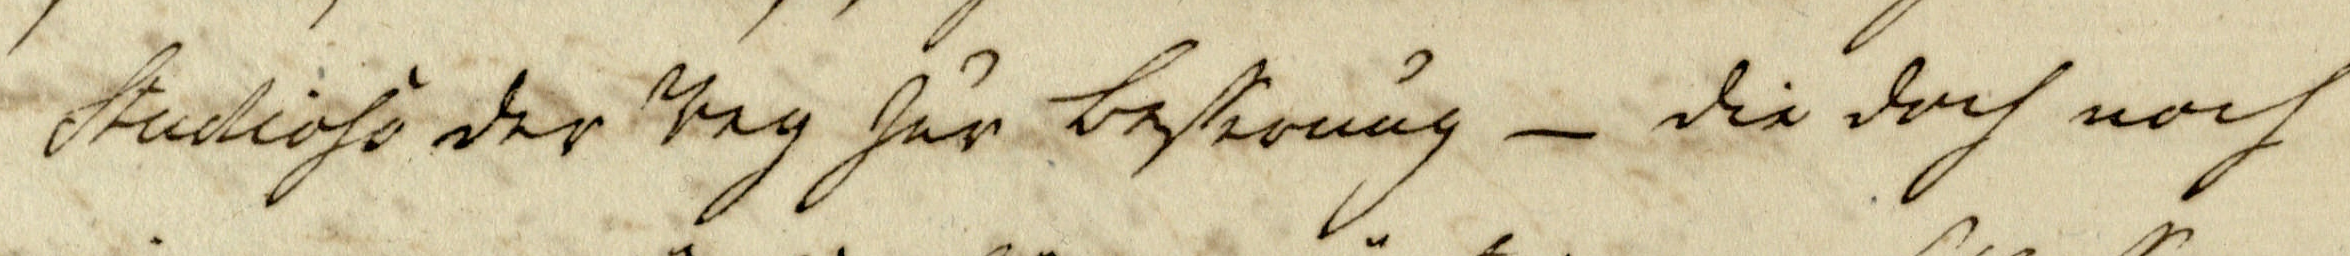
Studioso der Weg zur Besserung die doch noch
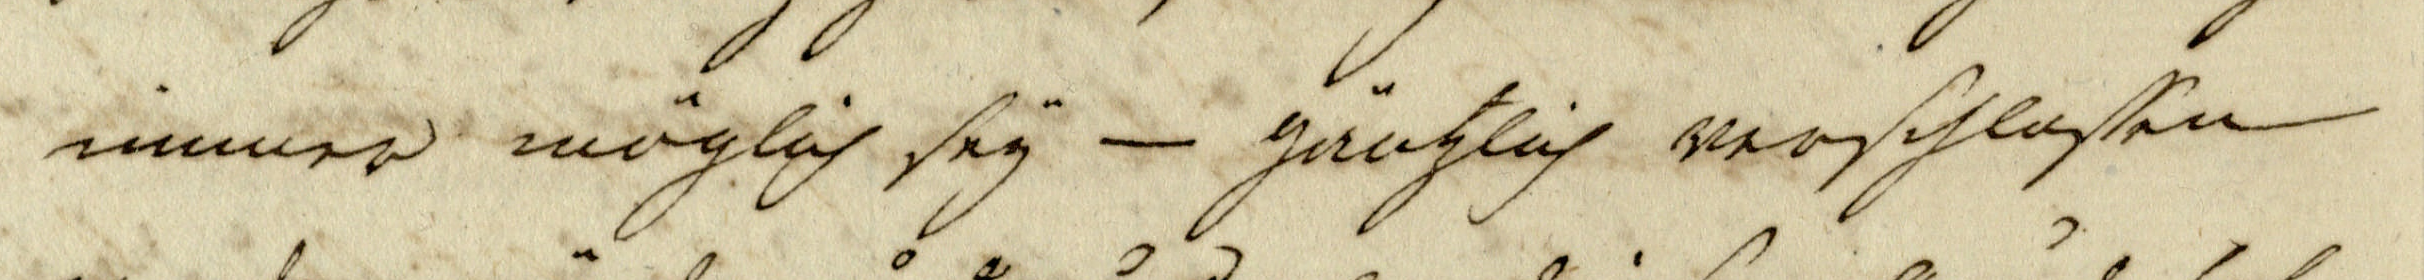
immer möglich seÿ gäntzlich verschlossen
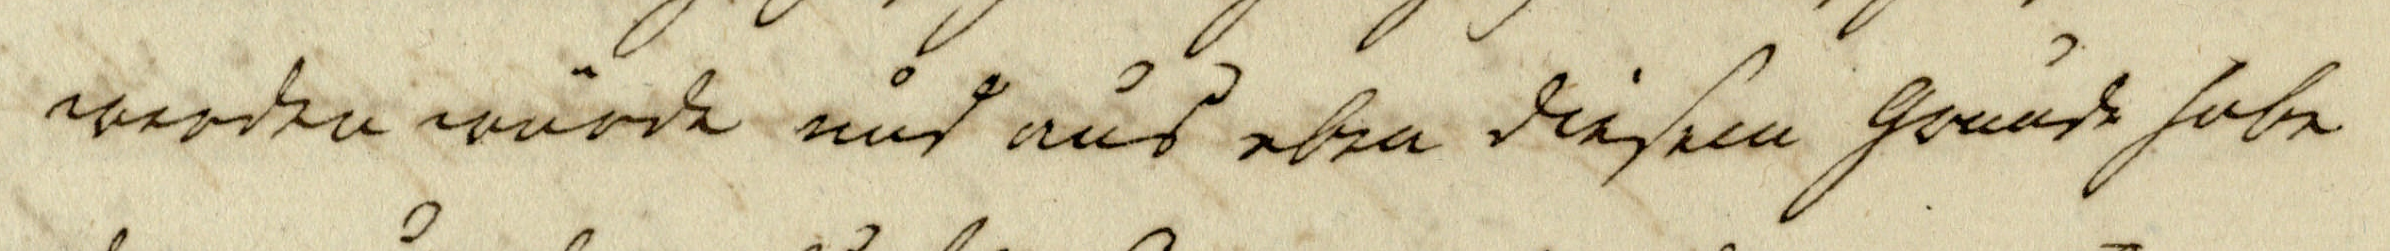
werden würde und aus eben diesem Gründe habe
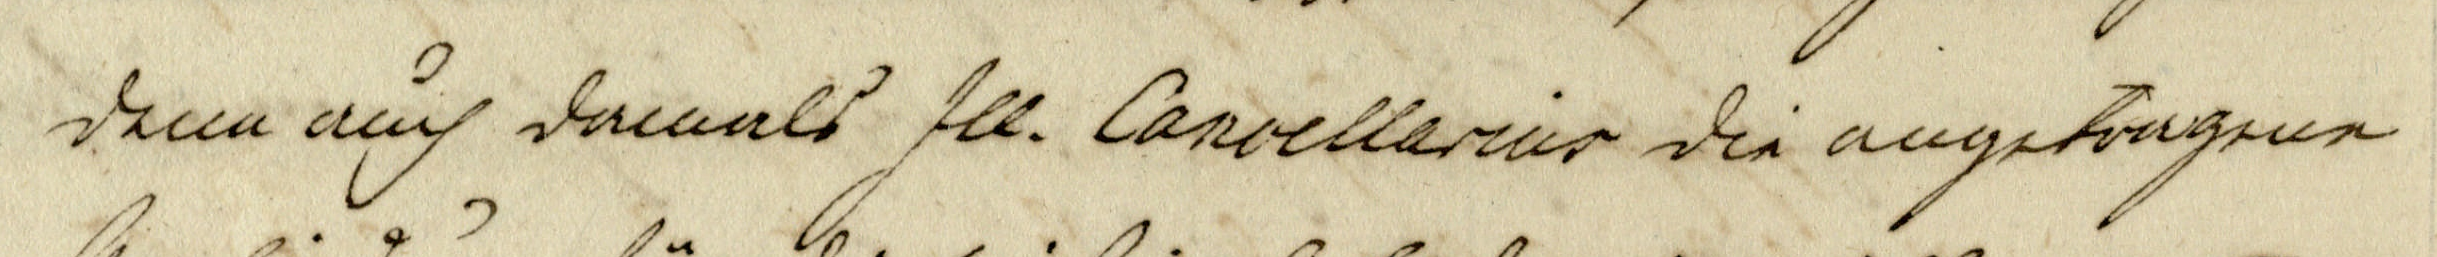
denn auch damals Ill. Cancellarius die angetragene
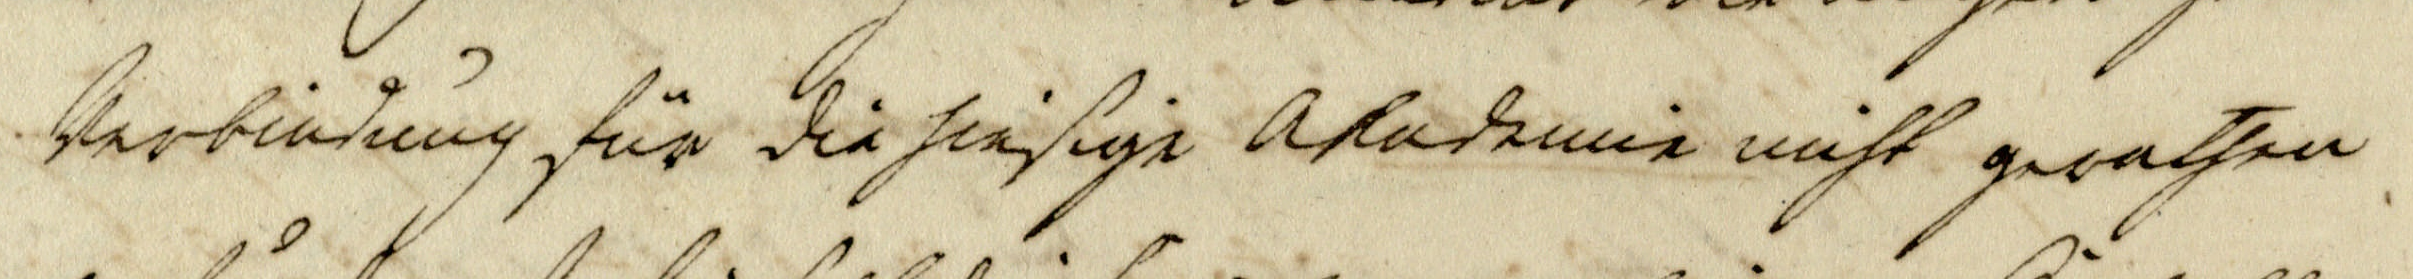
Verbindung für die hiesige Akademie nicht gerathen
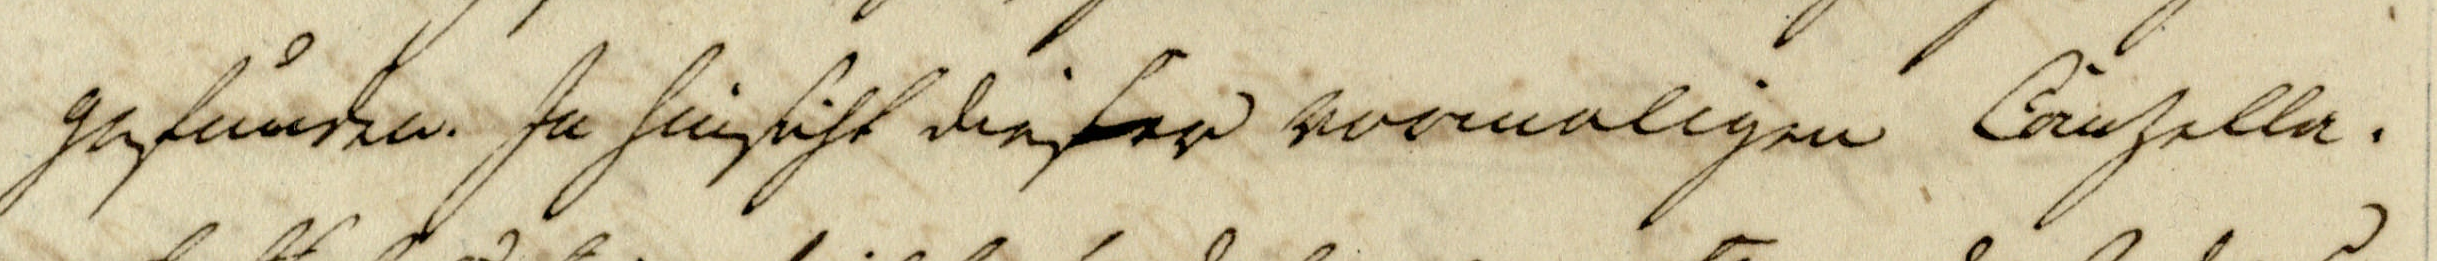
gefunden. In Hinsicht dieser vormaligen Canzella¬
